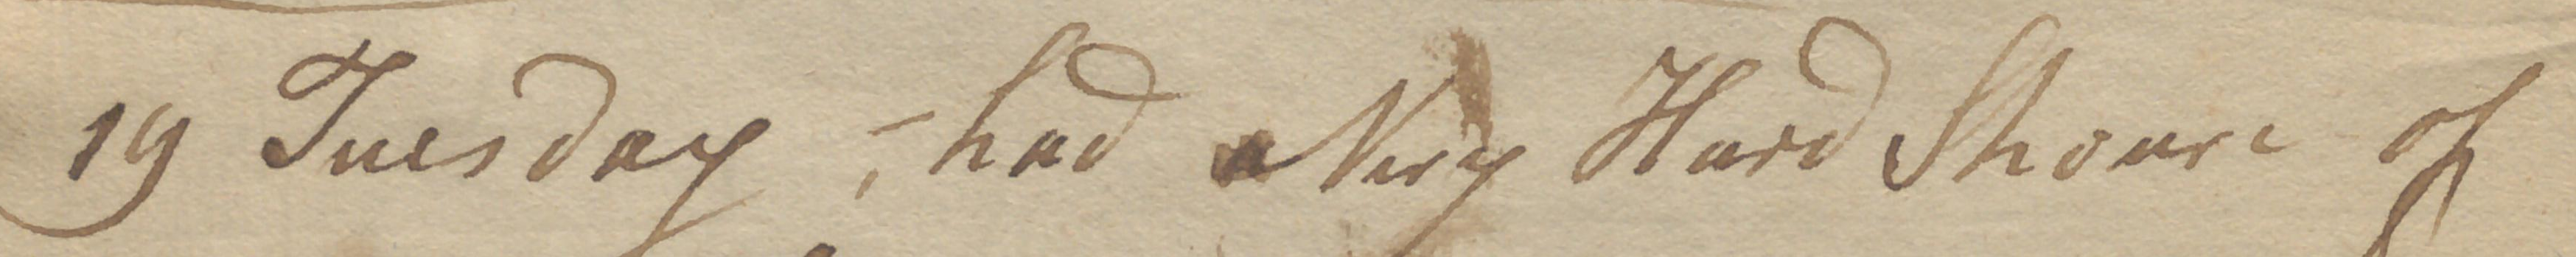19 Tuesday, had a Very Hard Shoure of
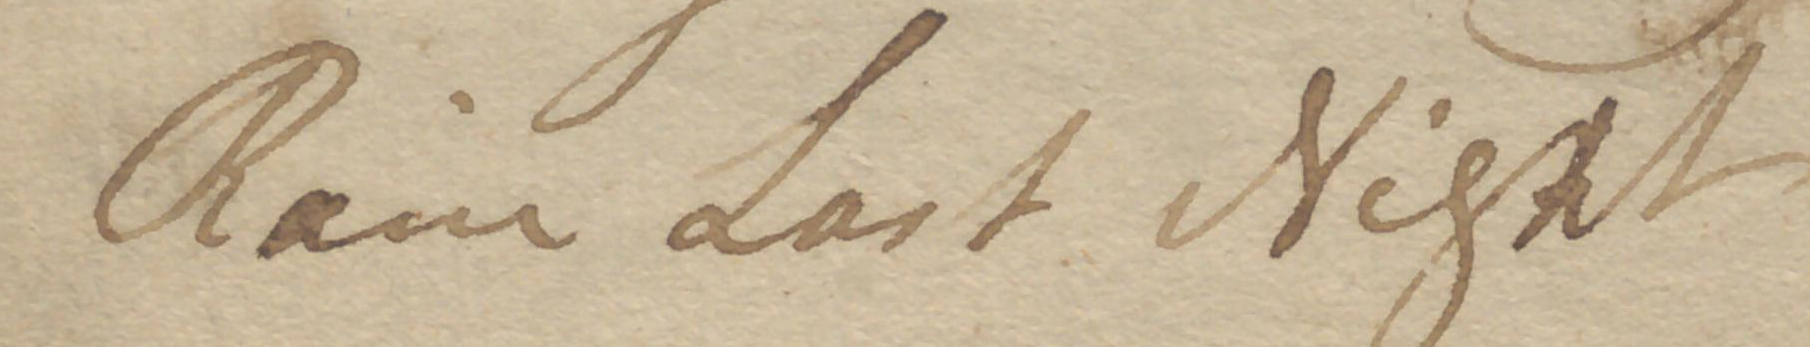Rain Last Night
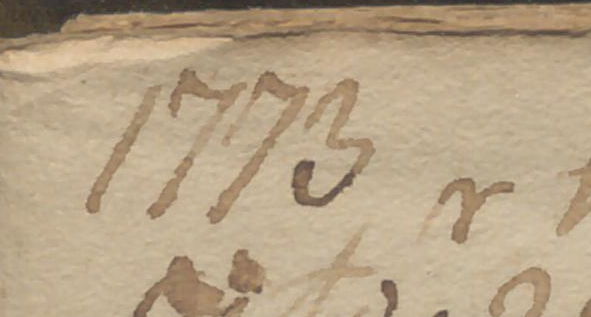1773
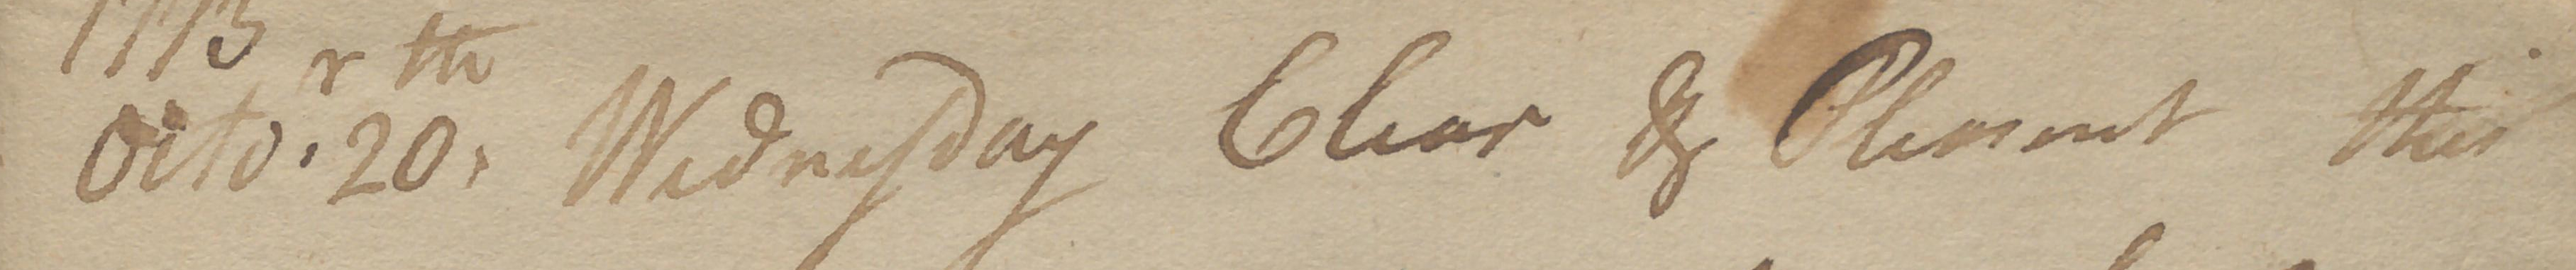Octo^r. 20^th. Wednesday Clear & Pleasent the
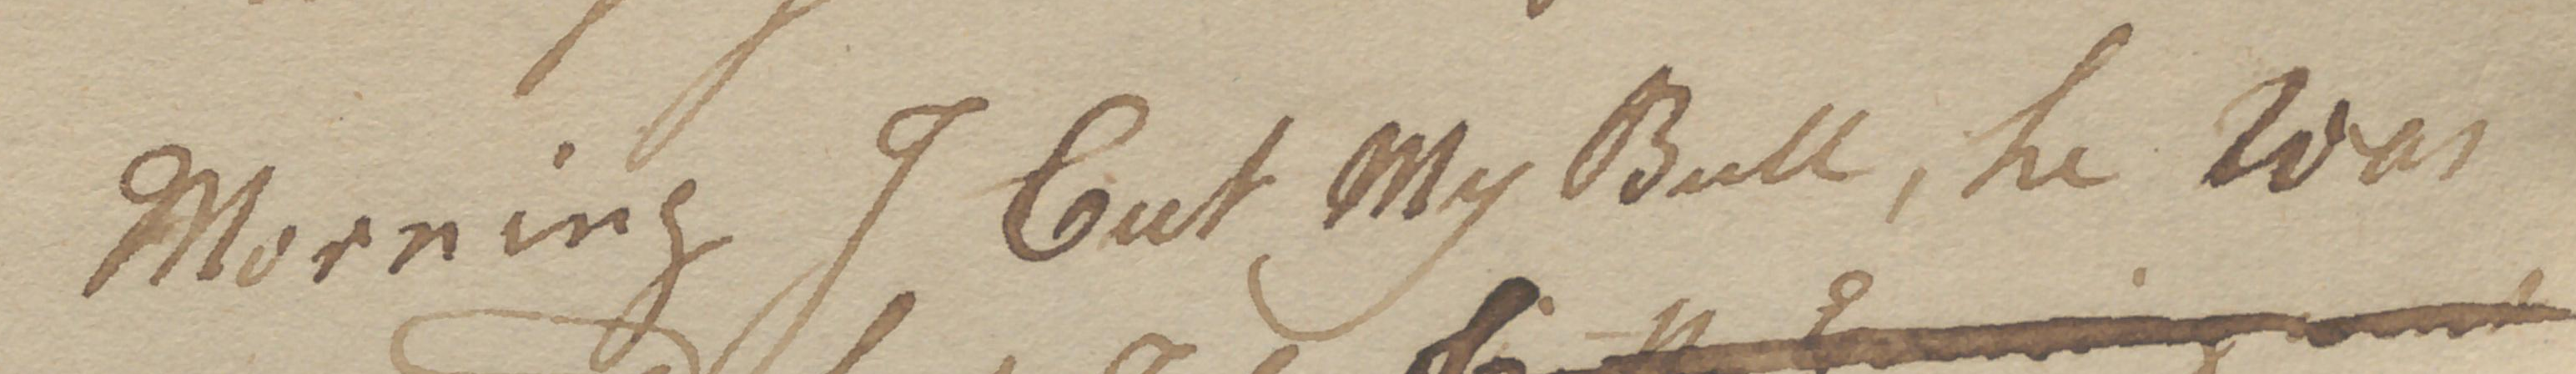Morning I Cut My Bull, he Was
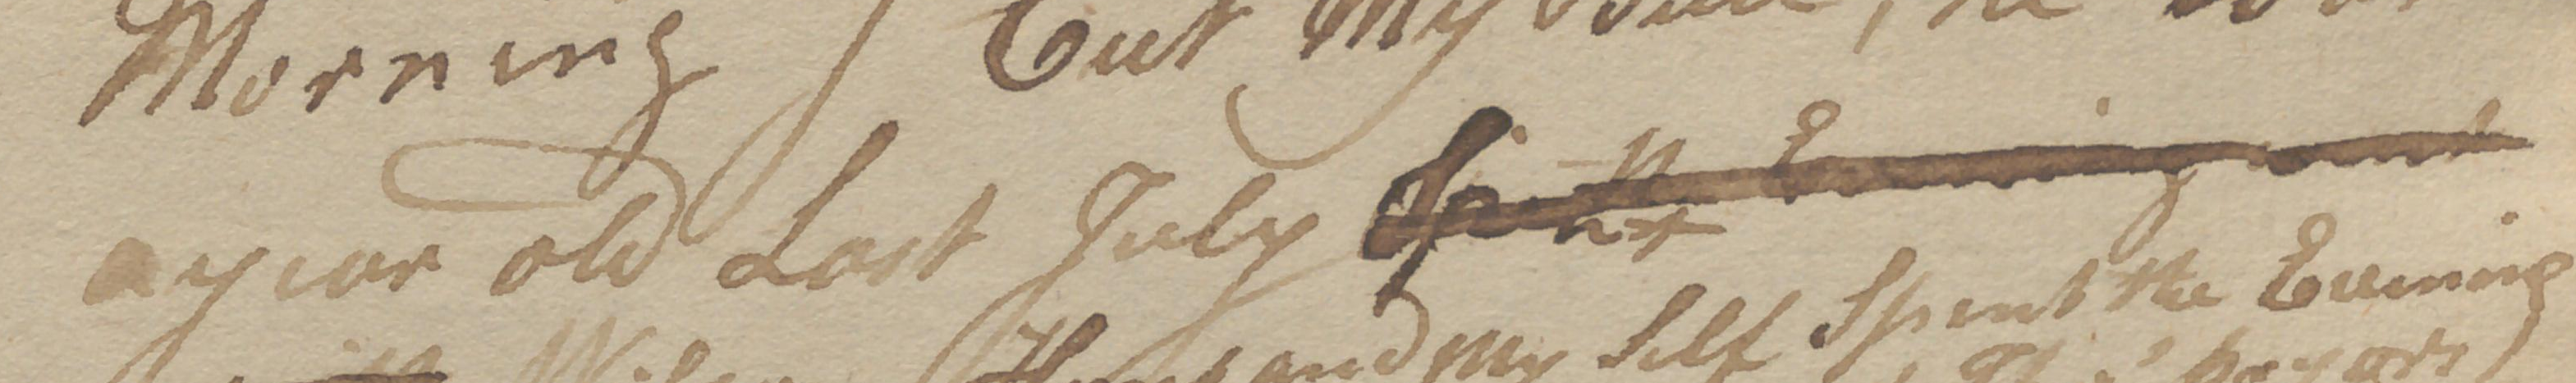year old Last July [spent Evening with]
